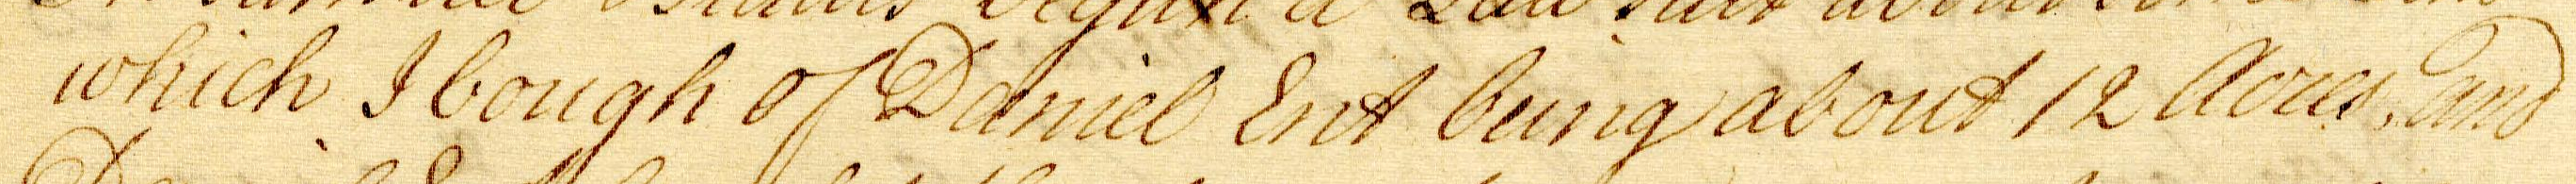which I bough of Daniel Ent being about 12 Acres, and
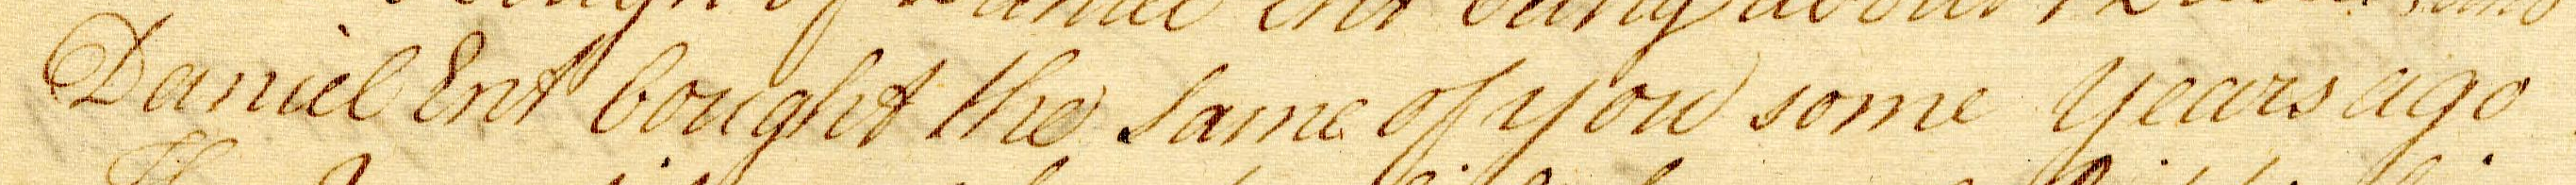Daniel Ent bought the Same of you some Years ago
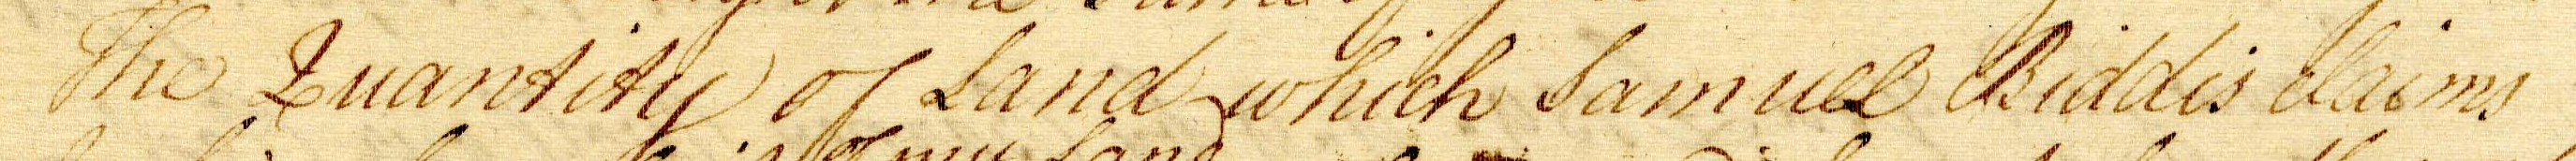the Quantity of Land which Samuel Biddis claims
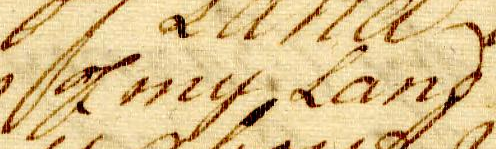of my Land
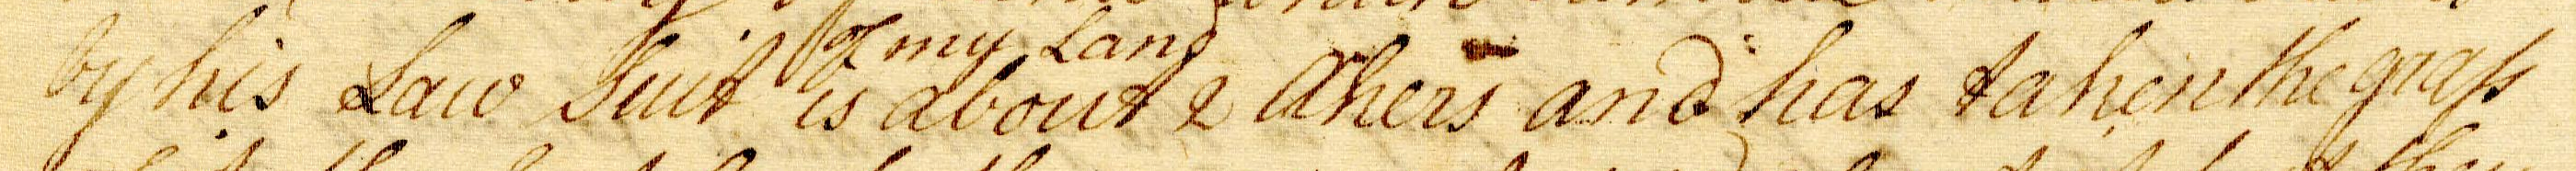by his Law Suit is about 2 Ahers and has taken the grass
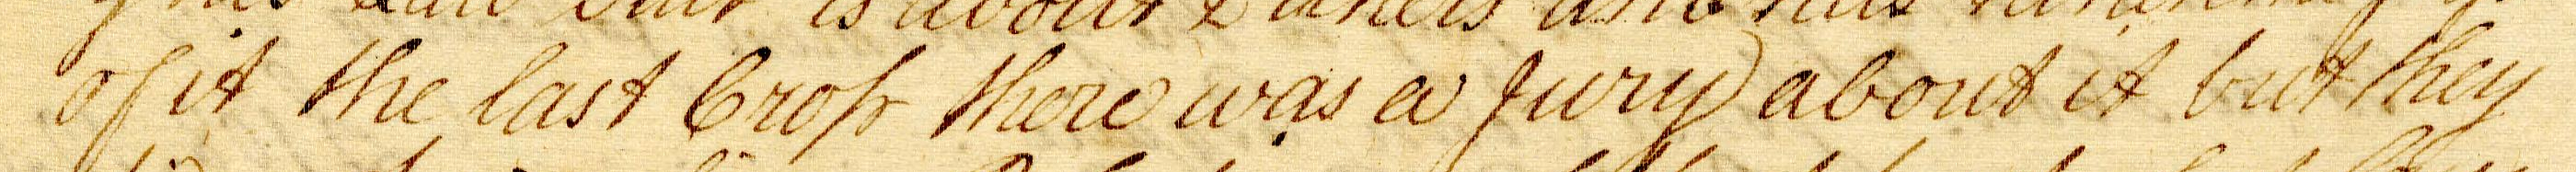of it the last Cross there was a Jury about it but they
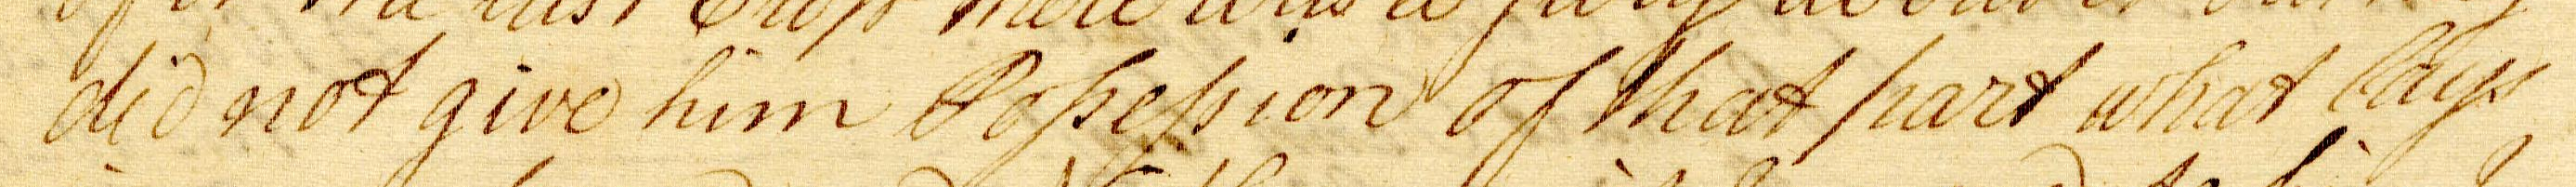did not give him Possession of that part what lays
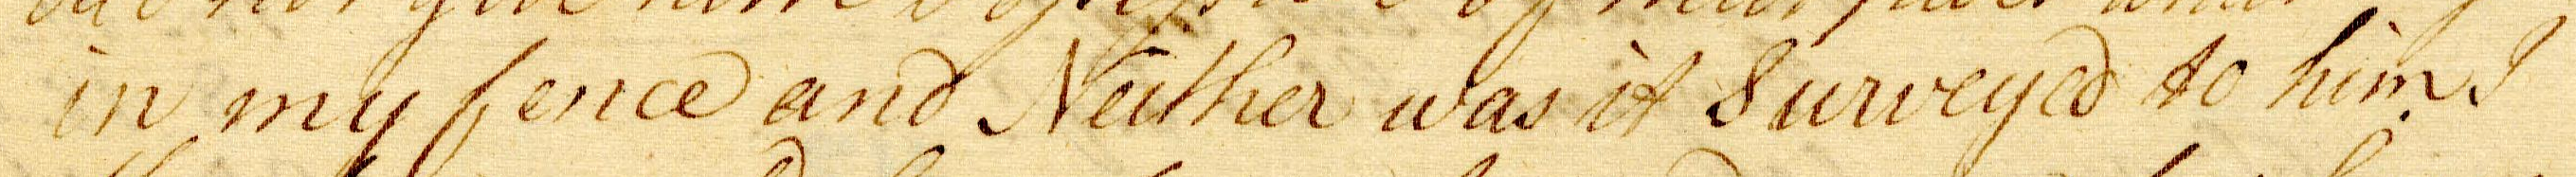in my fence and Neither was if Surveyed to him I
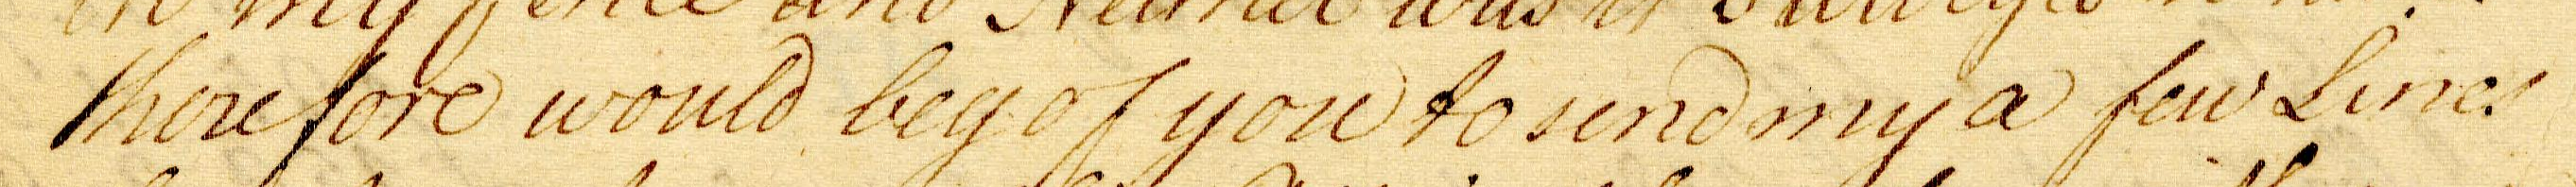therefore would beg of you to send my a few Lines
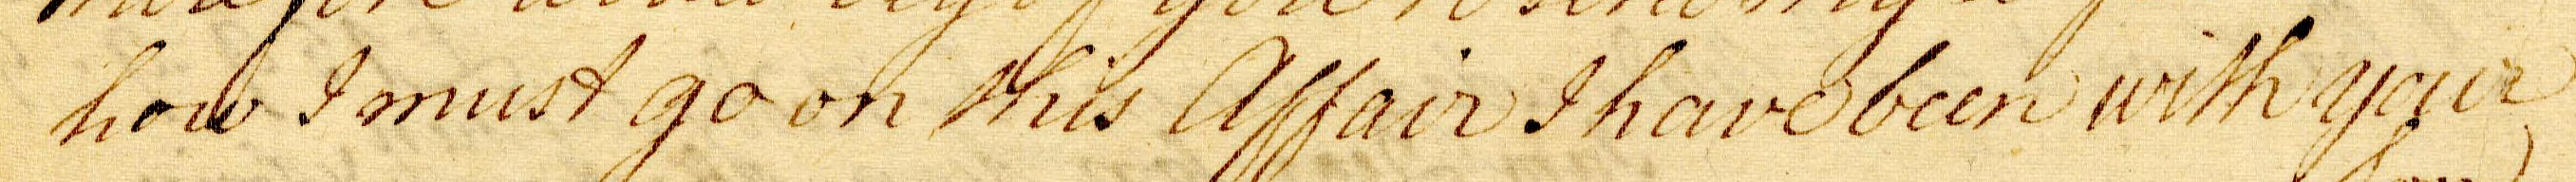how I must go on this Affair I have been with your
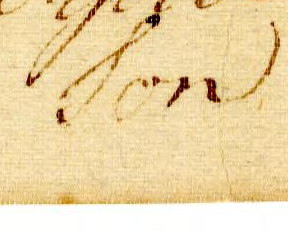Son
